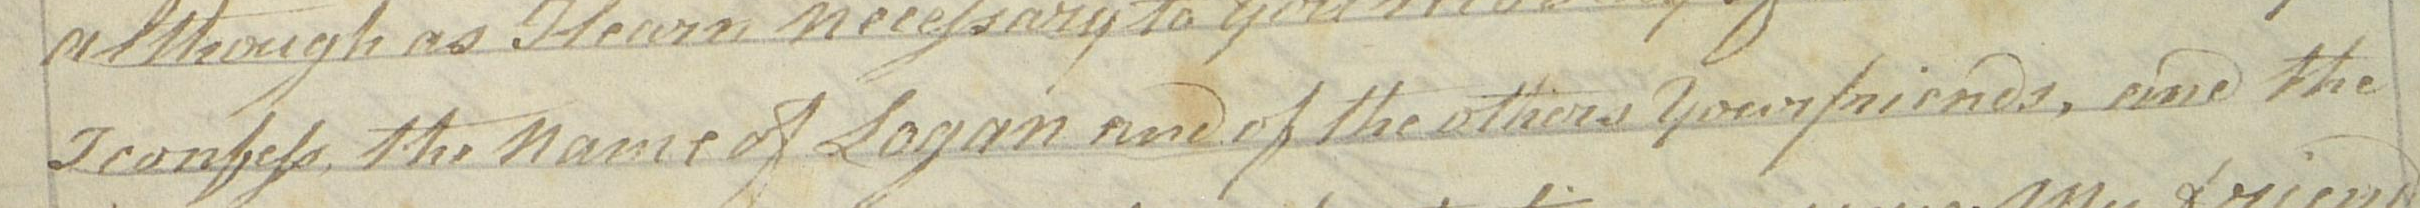I confess the name of Logan and of the others your friends, and the
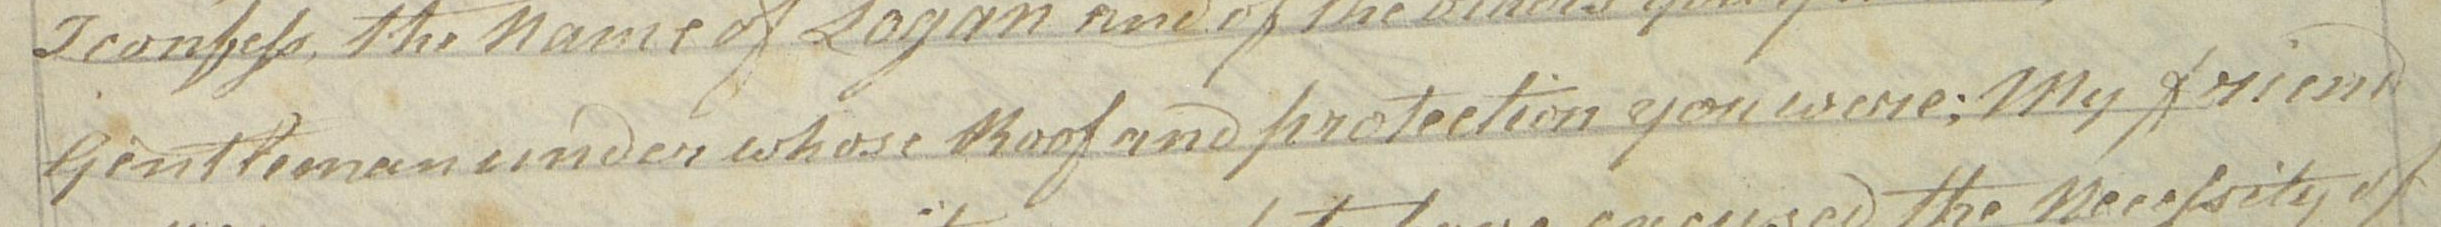Gentleman under whose Roof and protection you were: My friend
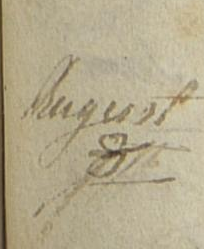August
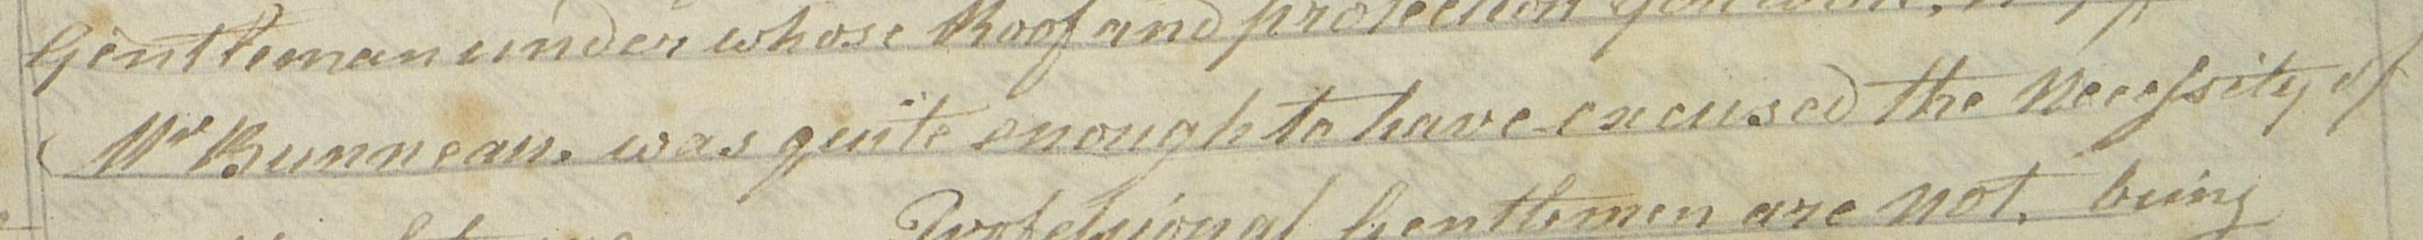M^r. Bunneau was quite enough to have excused the necessity of
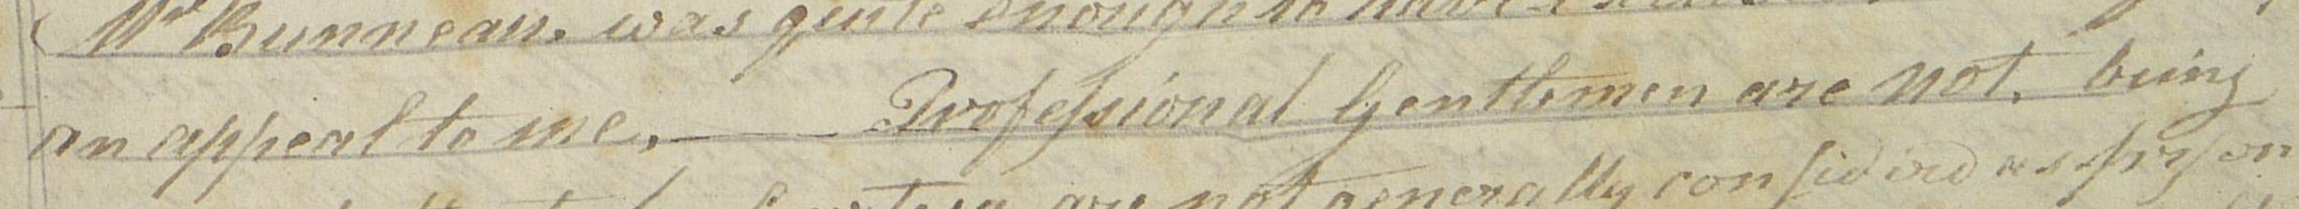an appeal to me, Professional Gentlemen are not. being
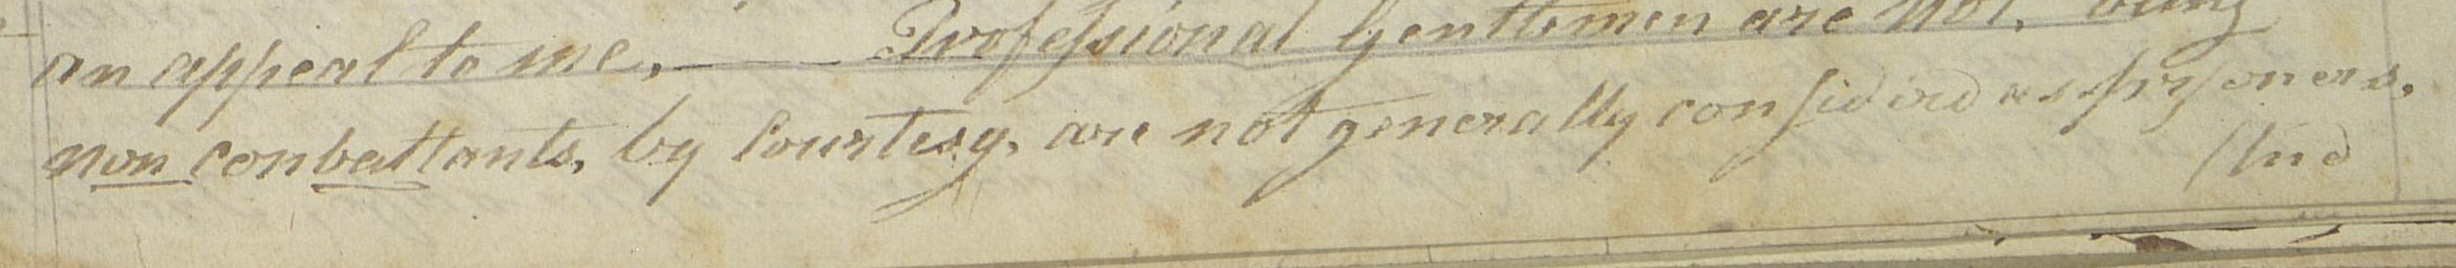non conbattants by Courtesy, are not generally considerd as prisoners,
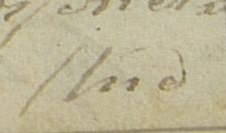And
